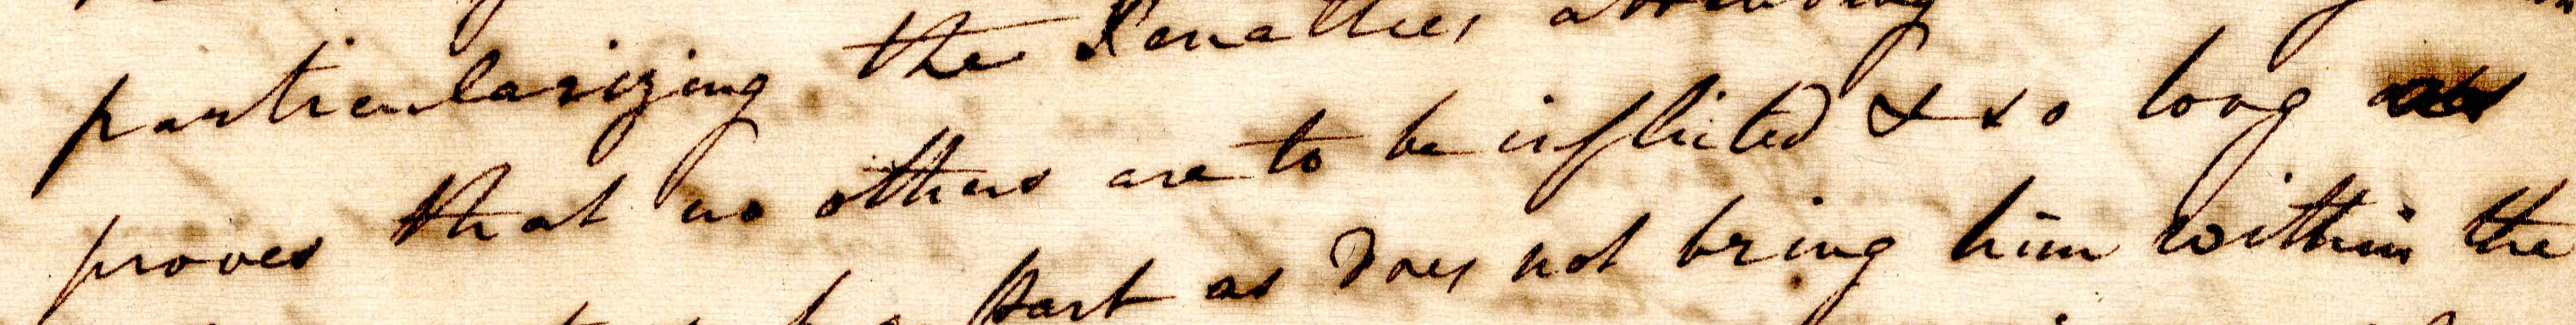proves that no other are to be inflicted & so long [___]
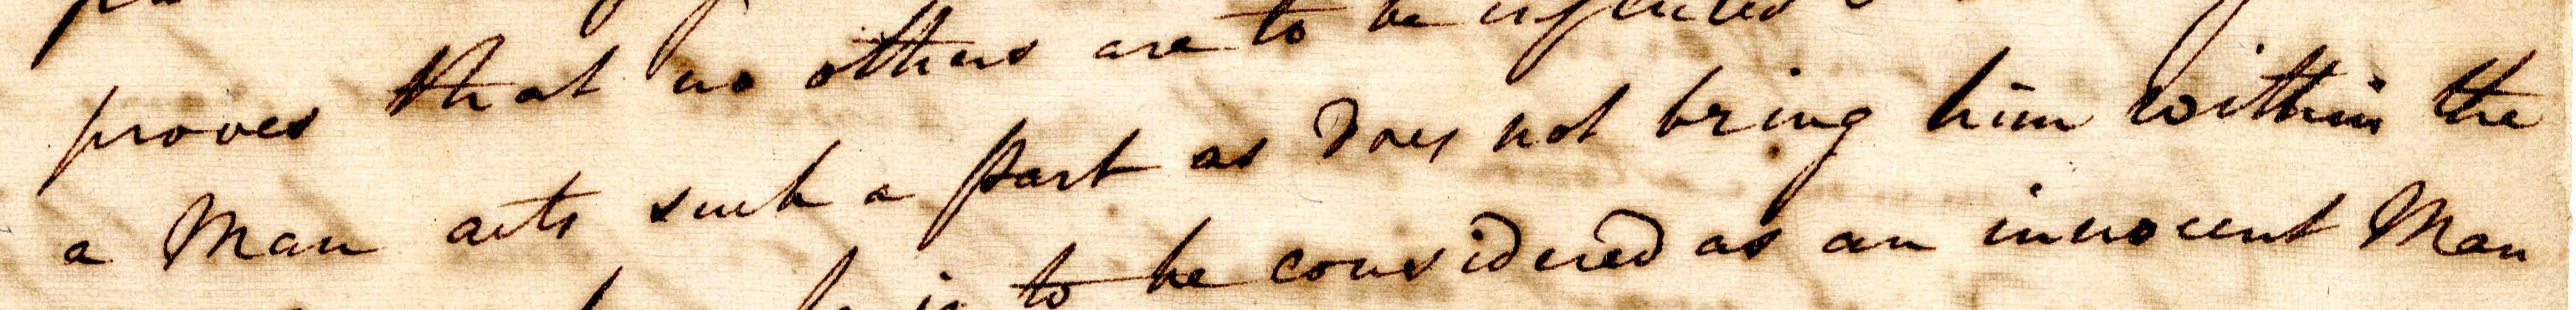a man acts such a part as does not bring him within the
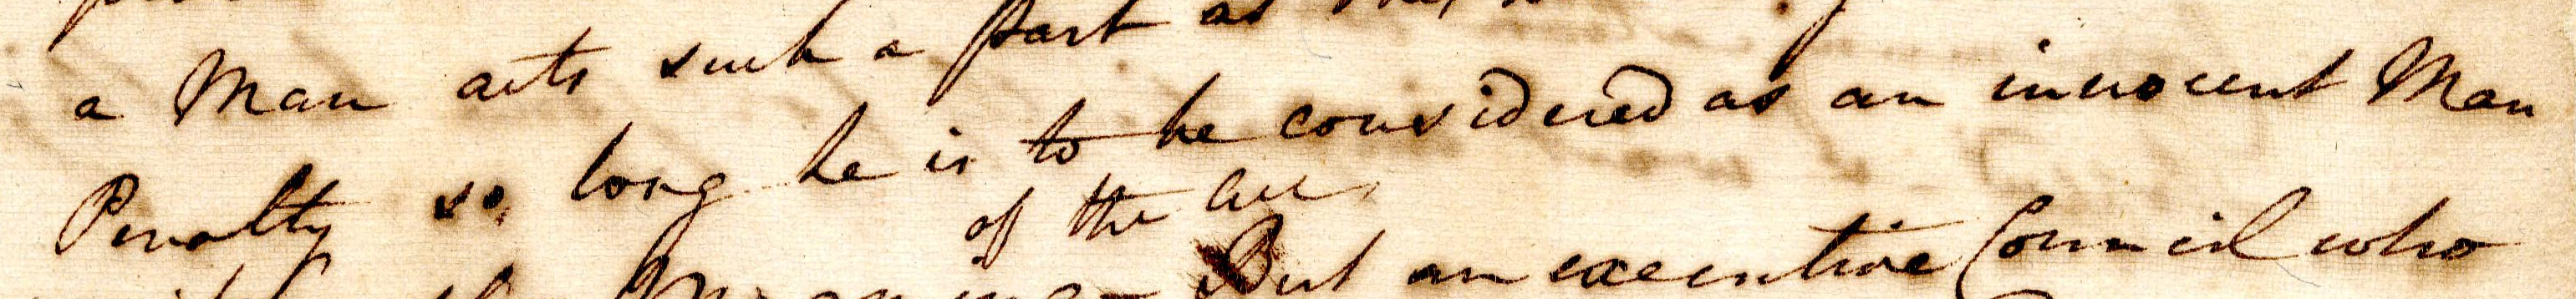Penalty so long he is to be considered as an innocent Man
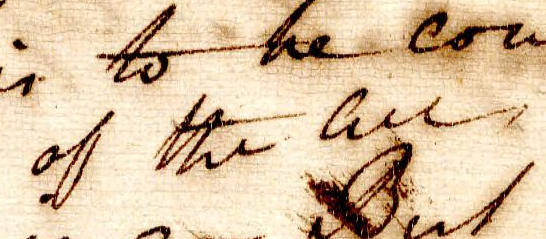of the Act
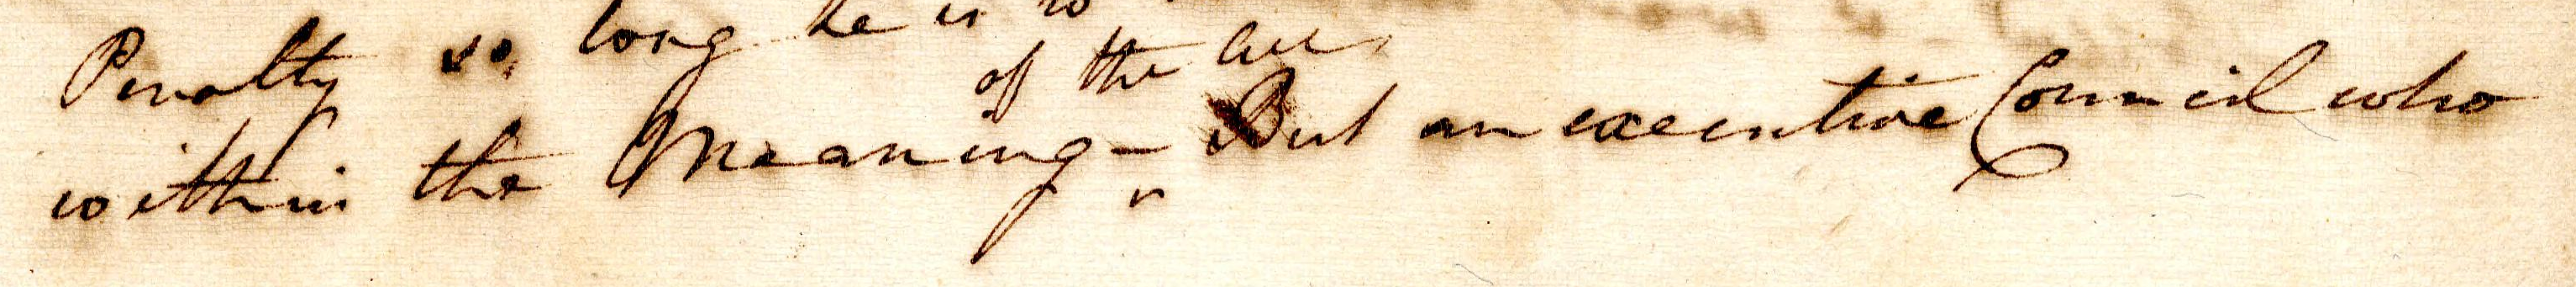within the Meaning ^. But an executive Council who
